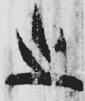之
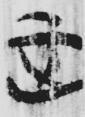正（政）
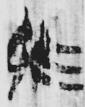於
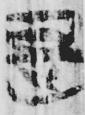是
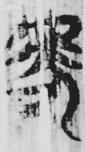唬（乎）
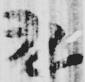九
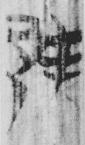邦
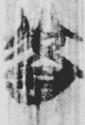畔（叛）
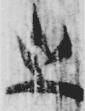之
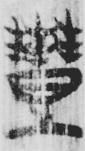豐
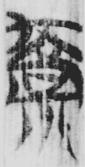○（鎬）
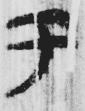于
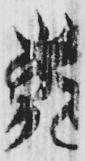鹿
